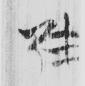隹
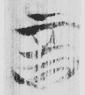酉
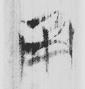甬
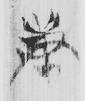庚
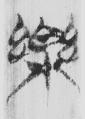樂
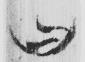曰
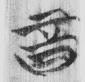酉
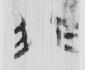非
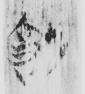飤
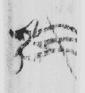隹
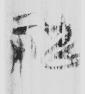神
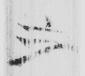之
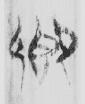卿
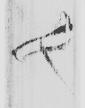民
